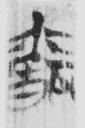{尒䎽}
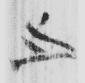之
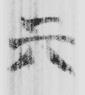亓
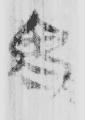胃
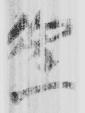𫊟
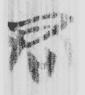君
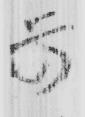可
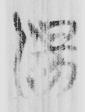湯
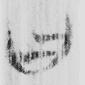曰
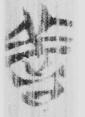善
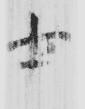才
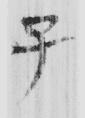子
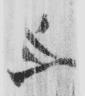之
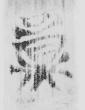員
